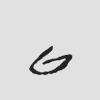㠯（以）
